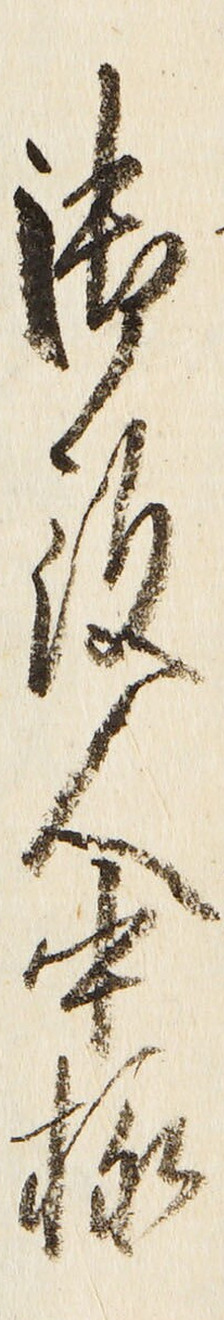御役人中様
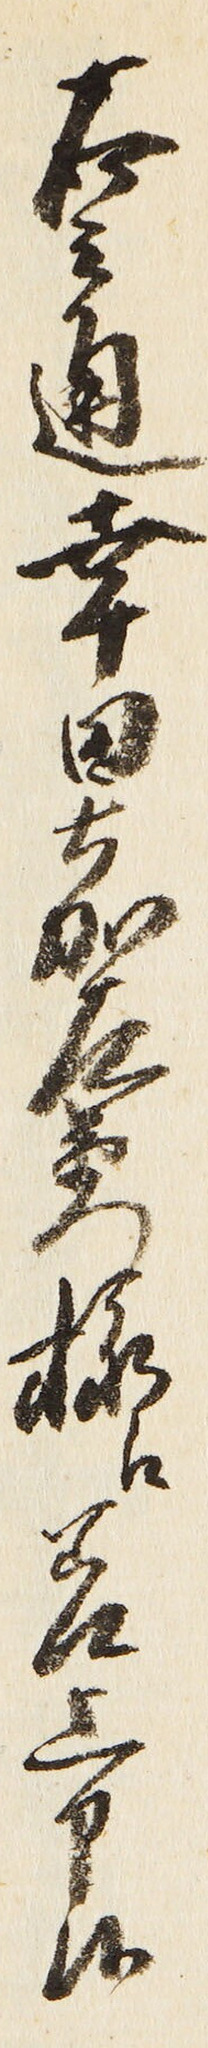右之通幸田嘉左衛門様江差上申候
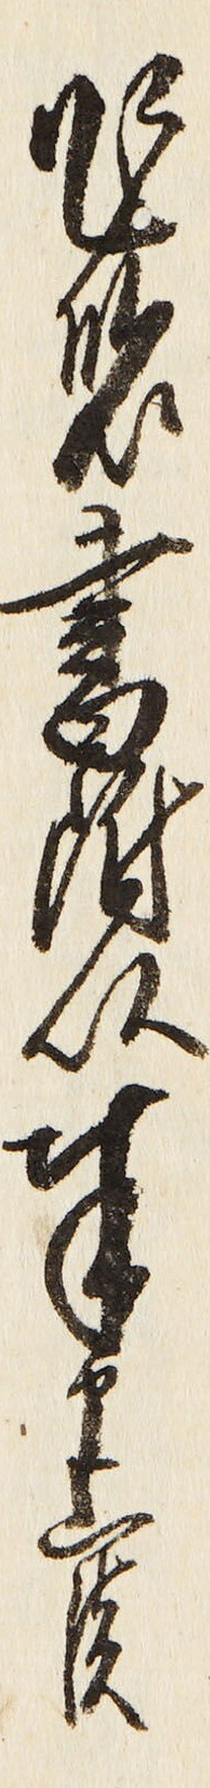乍恐書付以奉申上候
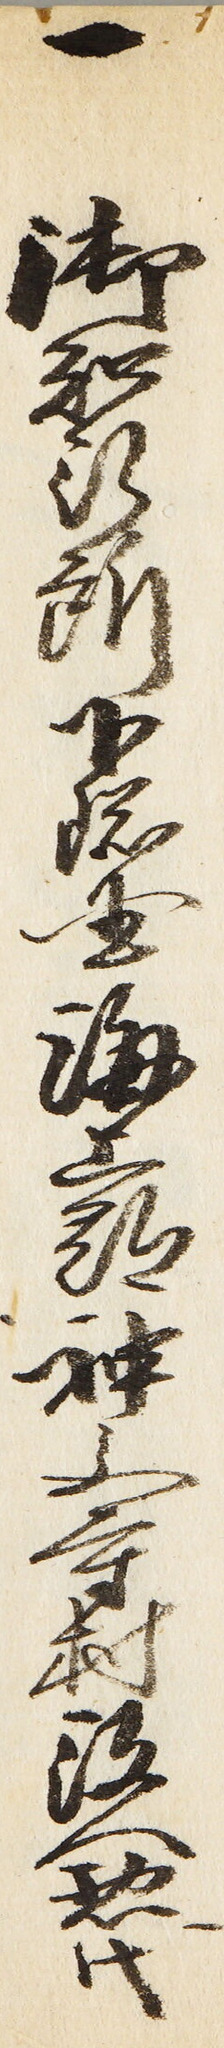一御知行所下総国海上郡神宮寺村役人惣代
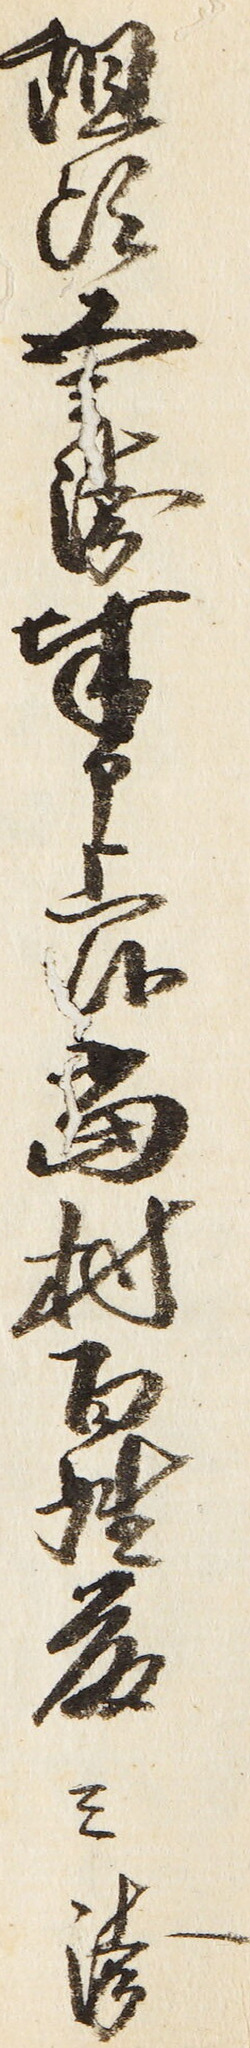組頭五兵衛奉申上候当村百姓藤兵衛
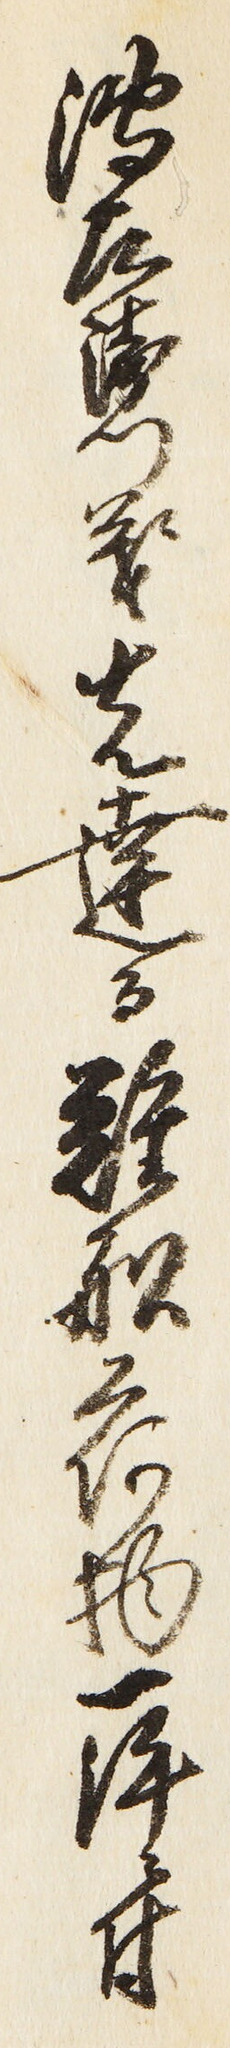伝左衛門義先達而難船荷物一件ニ付
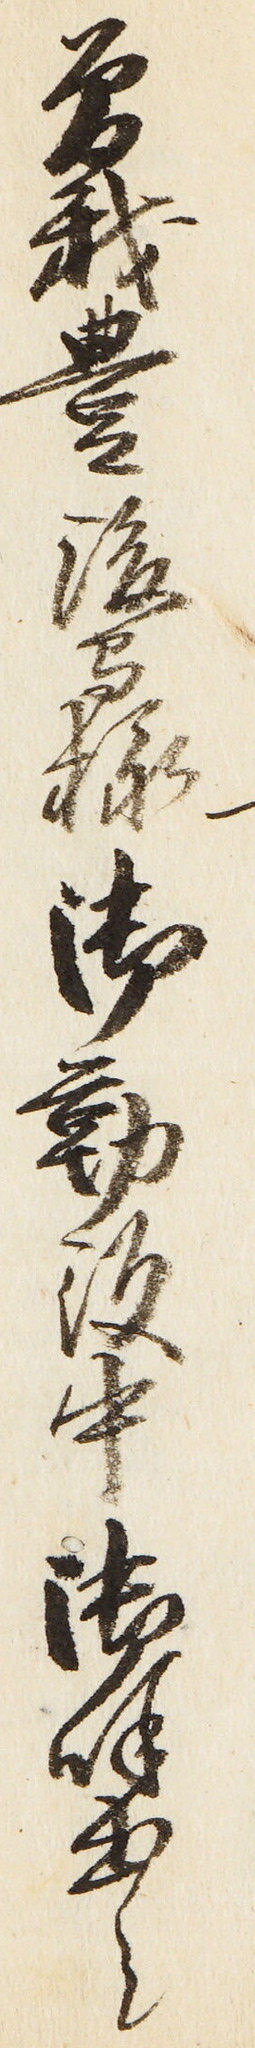曽我豊後守様御勤役中御呼出し
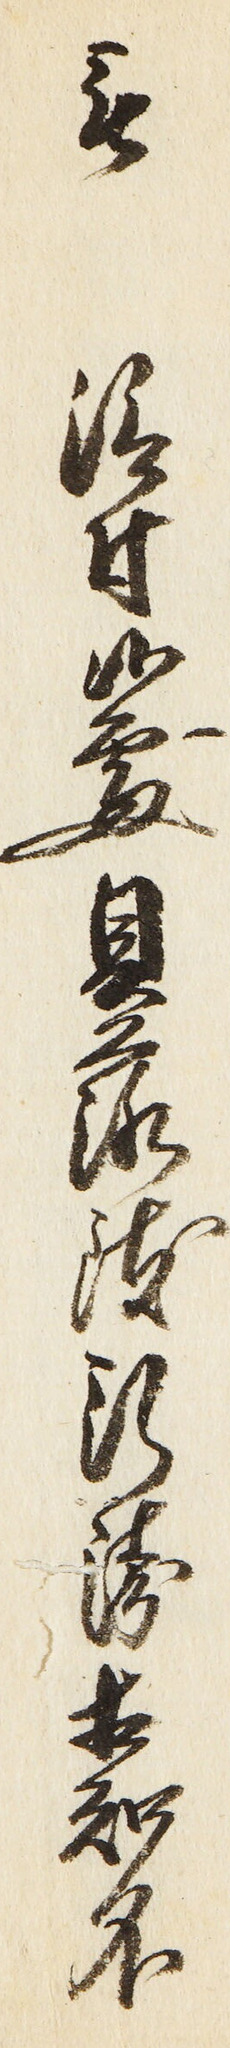被仰付候処貝落致行衛相知不
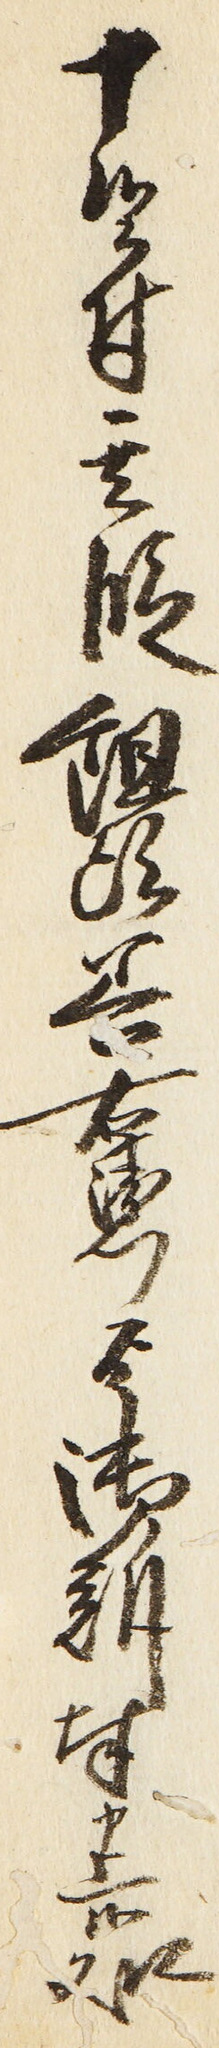申候ニ付其段組頭善右衛門ゟ御訴奉申上候処

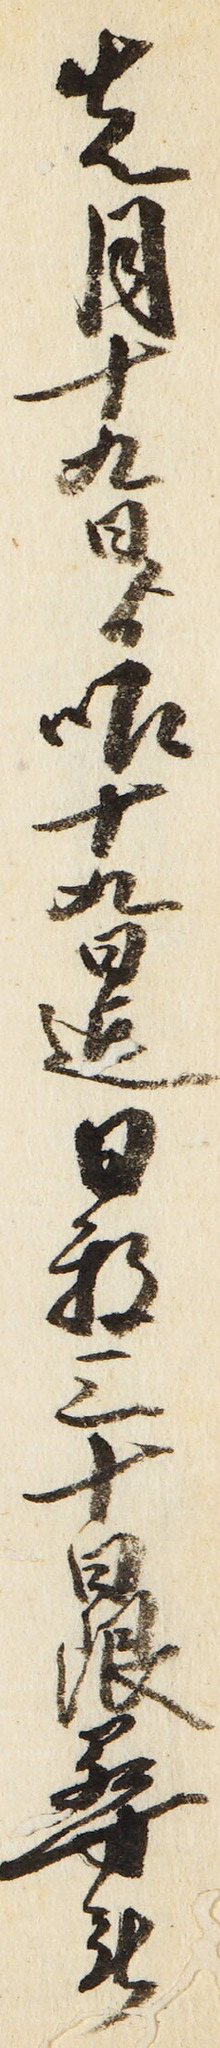先月十九日ゟ昨十九日迄日数三十日限尋被
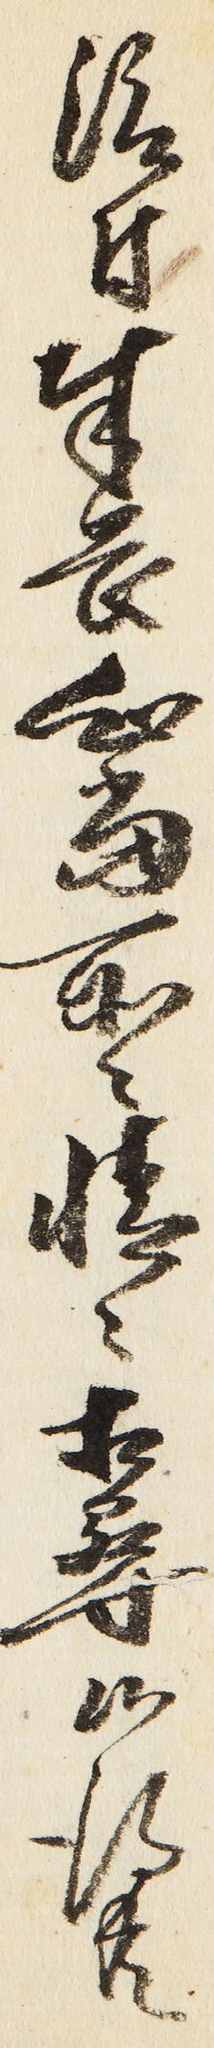仰付奉畏心当所々情々相尋候得共
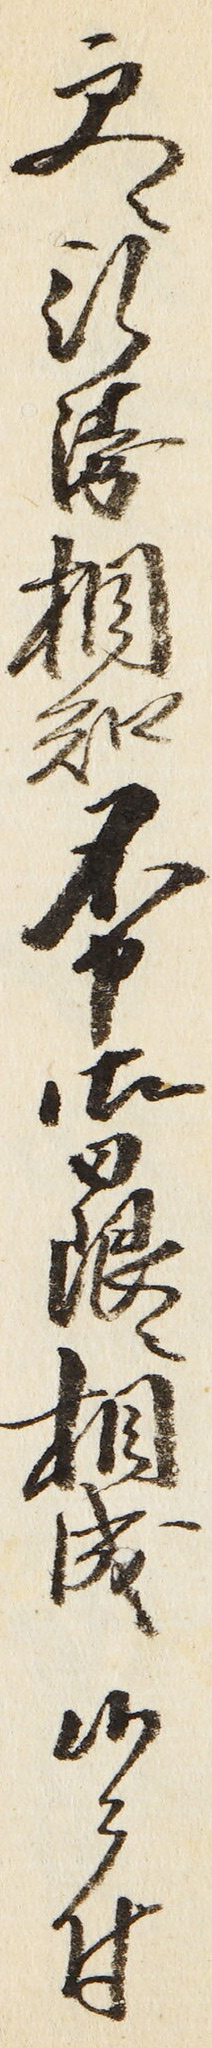更ニ行衛相知不申御日限ニ相成候ニ付
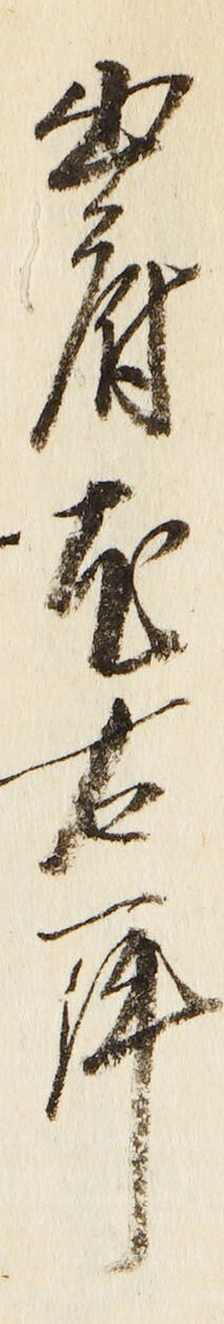出府仕尤右一件
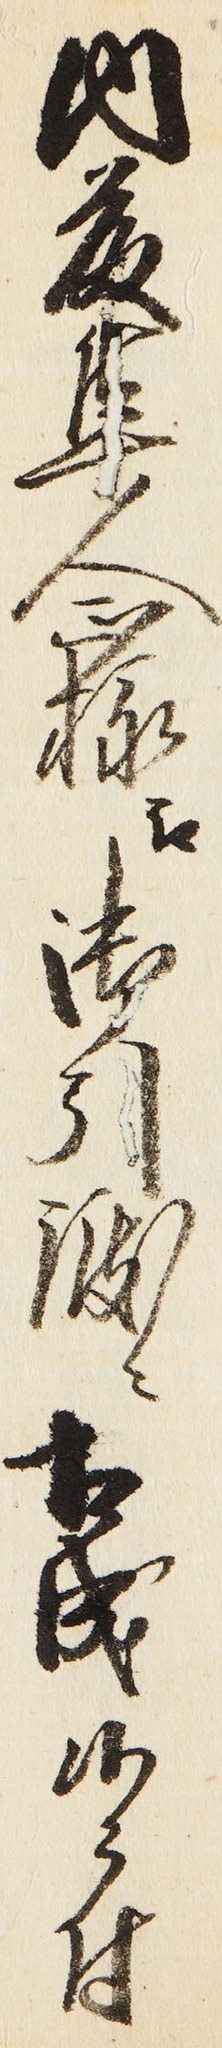内藤隼人正様江御引渡ニ相成候ニ付
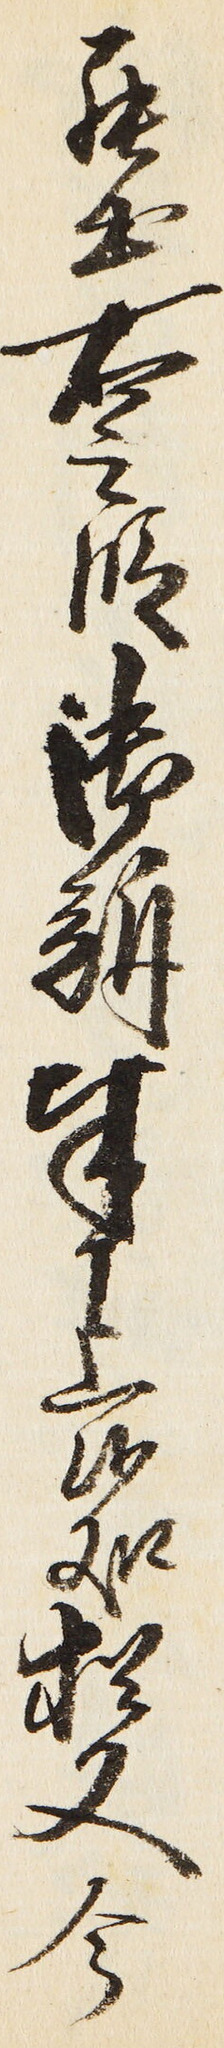罷出右之段御訴奉申上候処猶又今
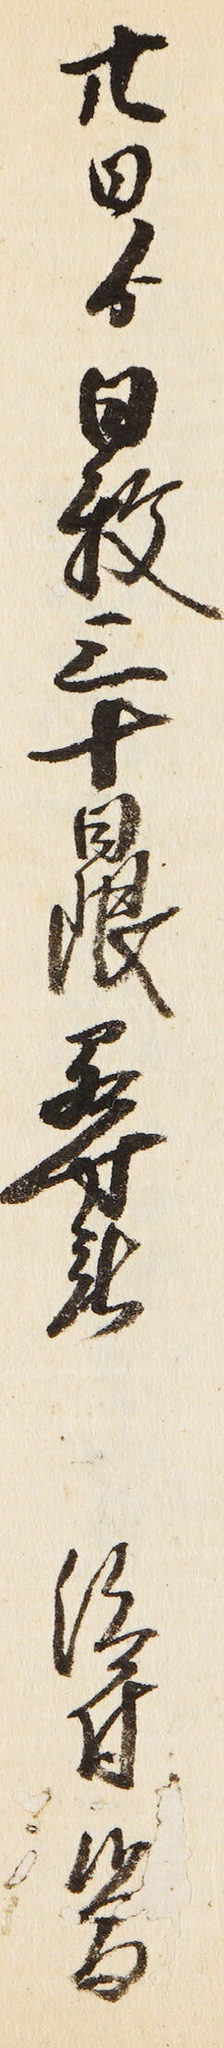廿日ゟ日数三十日限尋被仰付候間
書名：難船一件記録
